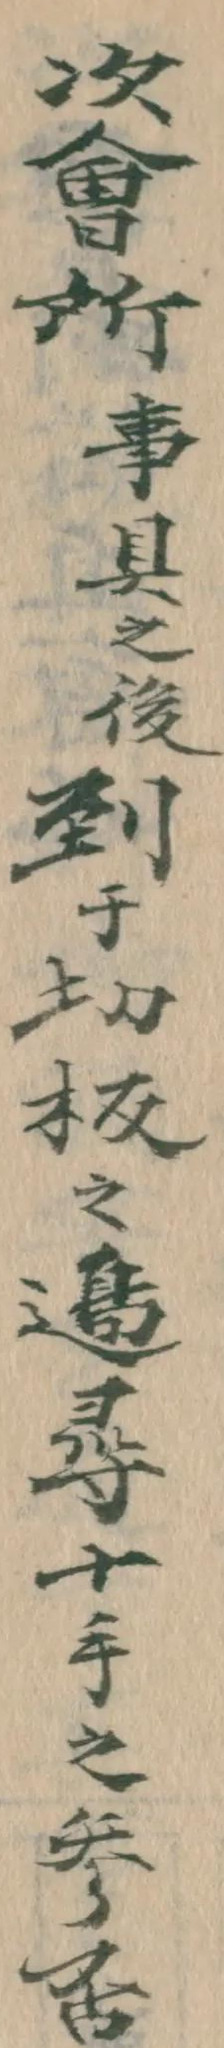次会所事具之後到于切板之辺尋十手之参否
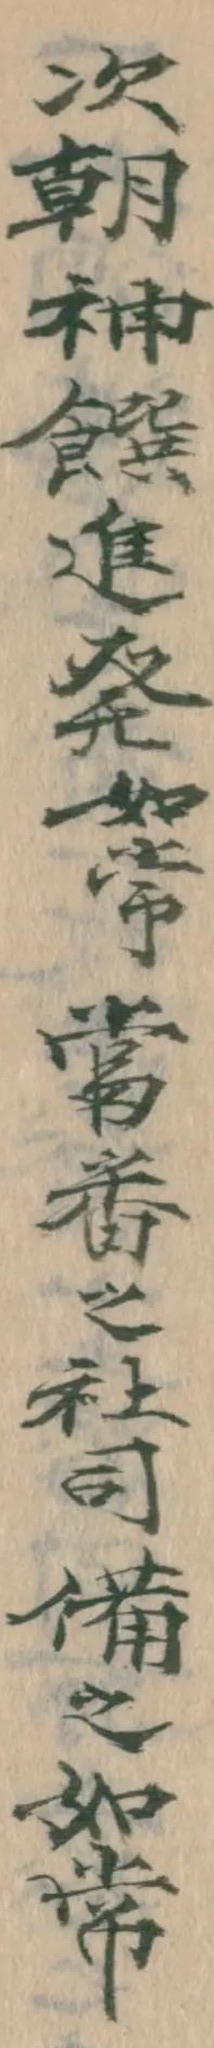次朝神饌進発如常当番之社司備之如常
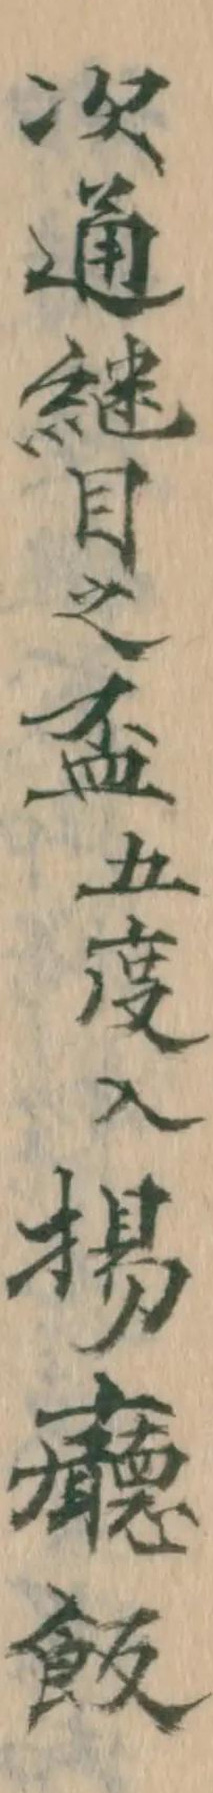次通継目之盃五度入揚庁飯
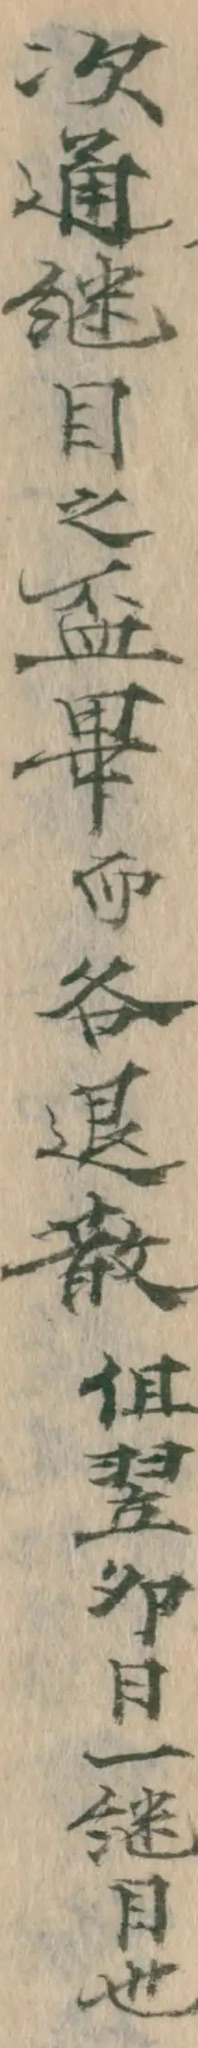次通継目之盃畢而各退散但翌卯日一継目也

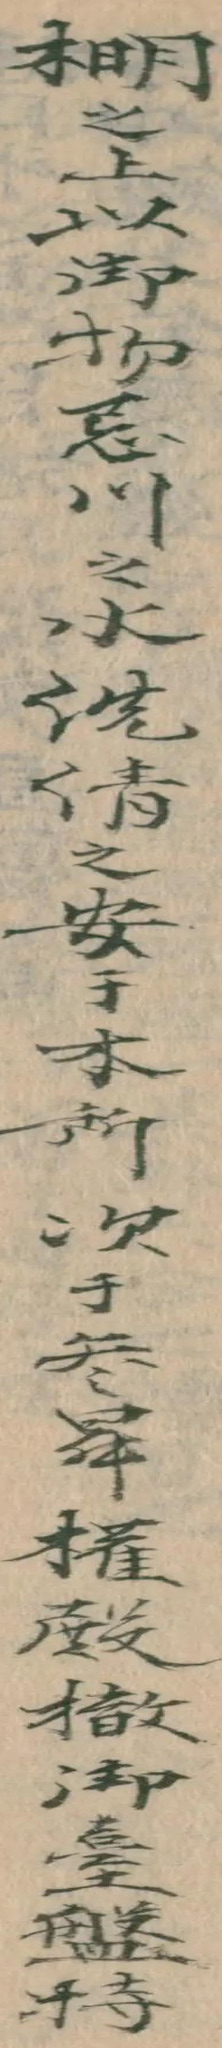棚之上以御物忌川之水洗清之安于本所次于参昇権殿撤御台盤持
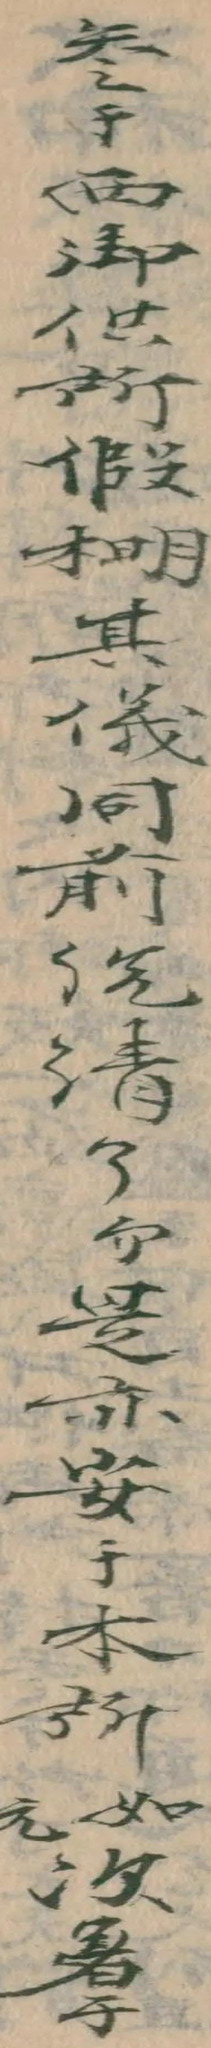参于西御供所仮棚其儀同前洗清了而是亦安于本所如元次着于
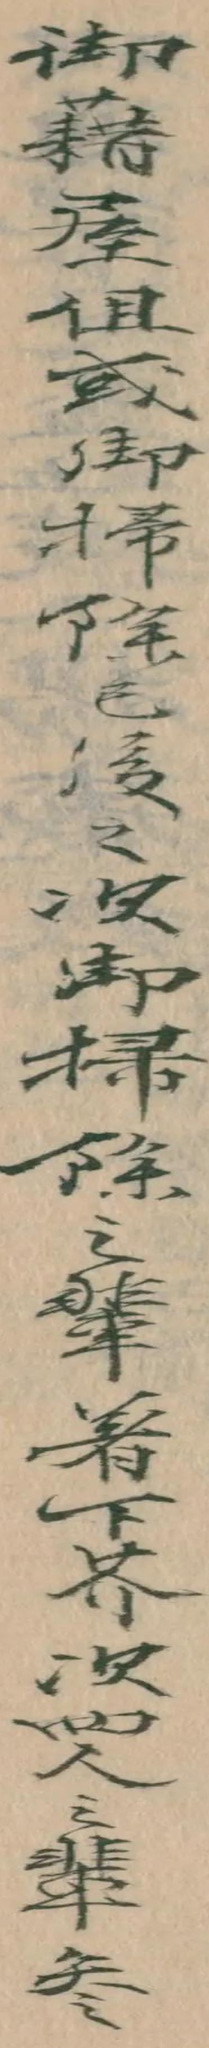御藉屋但或御掃除已後之次御掃除之輩着下芥次四人之輩参
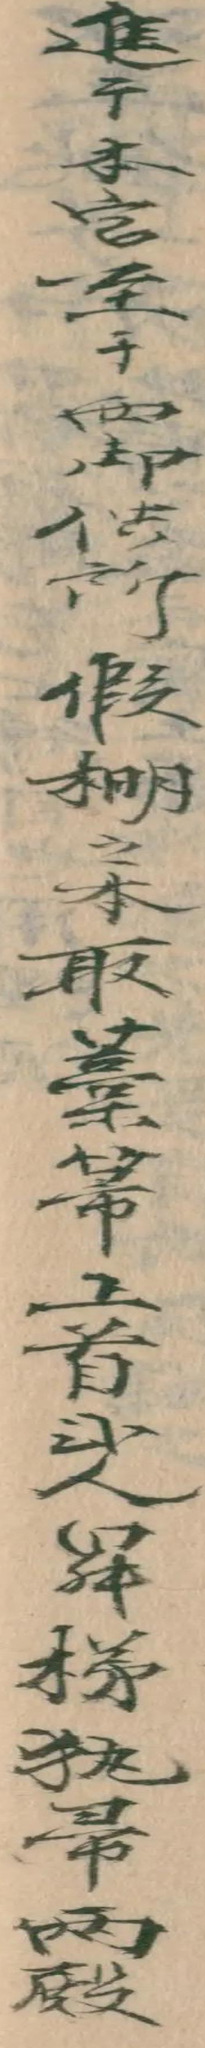進于本宮至于西御供所仮棚之本取藁箒上首弐人昇梯執帚両殿
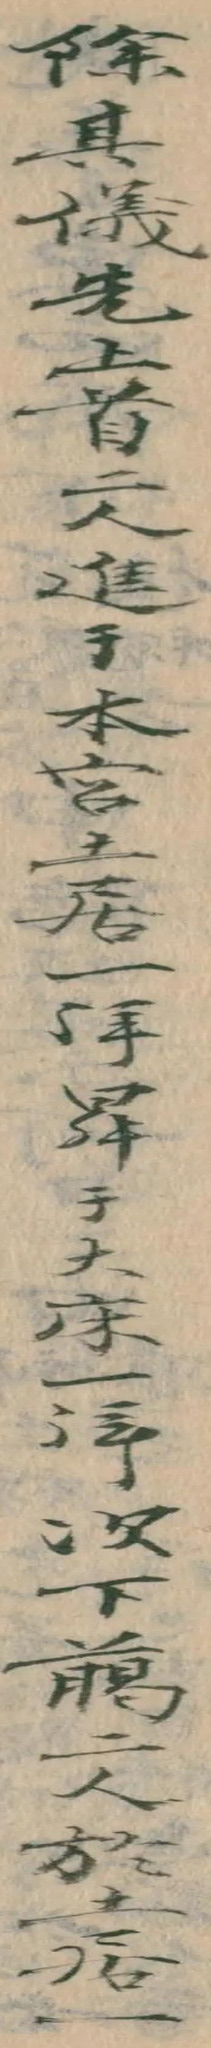除其儀先上首二人進于本宮土居一拝昇于大床一拝次下臈二人於土居一

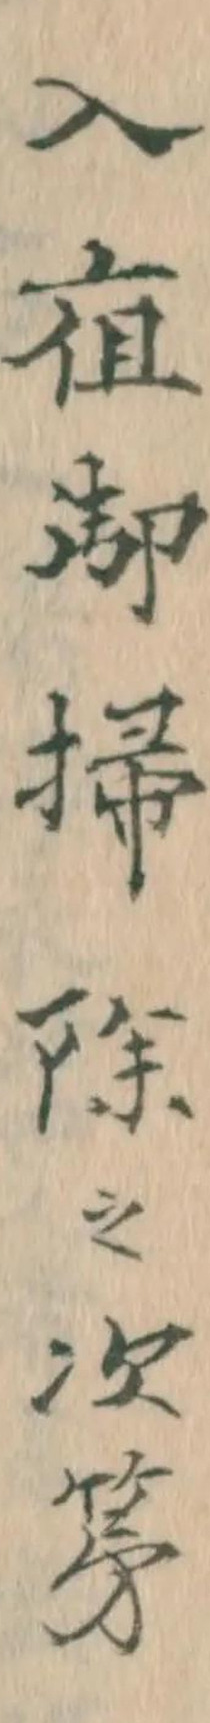入亱御掃除之次第
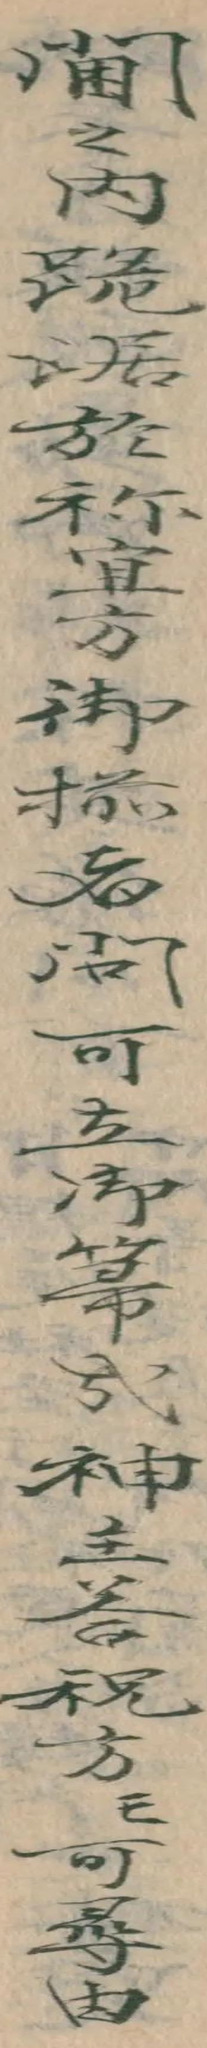閫之内跪踞於祢宜方御揃者問可立御箒哉神主答祝方モ可尋由
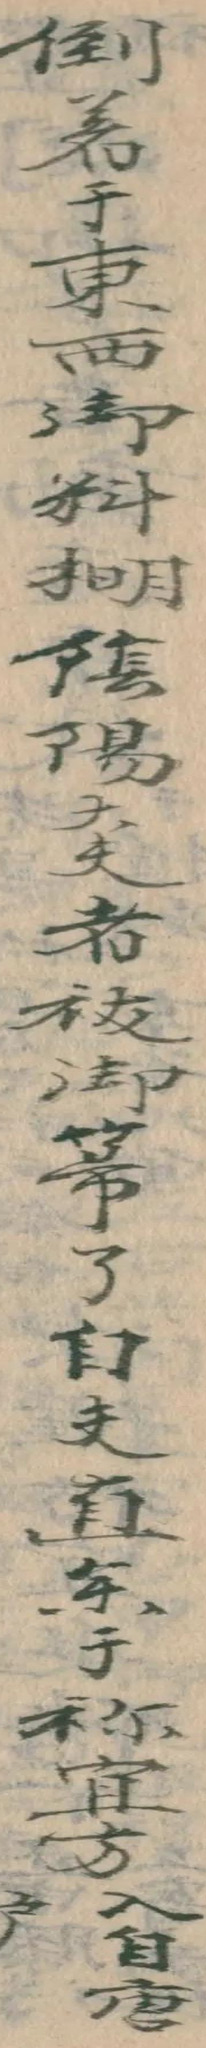倒着于東西御料棚陰陽大夫者祓御箒了自夫直参于称宜方入自唐戸
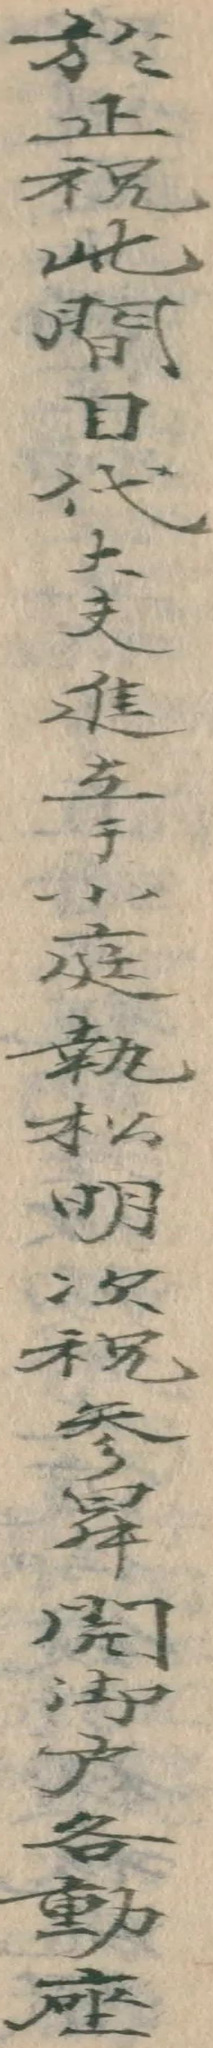於正祝此間目代大夫進立于小庭執松明次祝参昇開御戸各動座
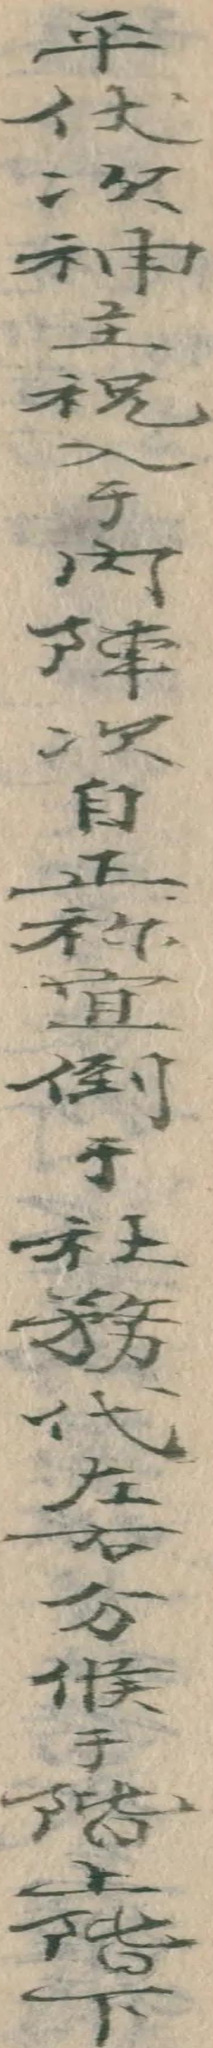平伏次神主祝入于内陣次自正祢宜倒于社務代左右分候于階上階下

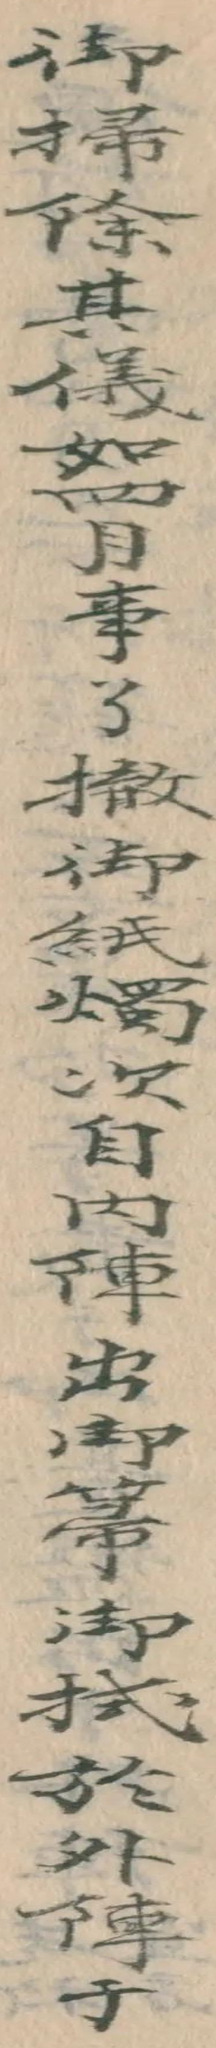御掃除其儀如四月事了撤御紙燭次自内陣出御箒御拭於外陣于
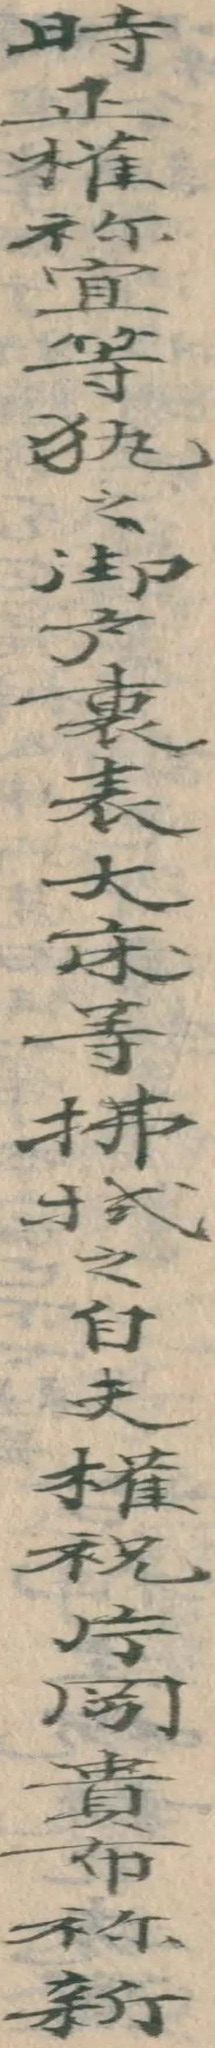時正権祢宜等執之御戸裏表大床等払拭之自夫権祝片岡貴ふね新
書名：賀茂社記録. 第9冊
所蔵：国立国会図書館 National Diet Library, JAPAN
